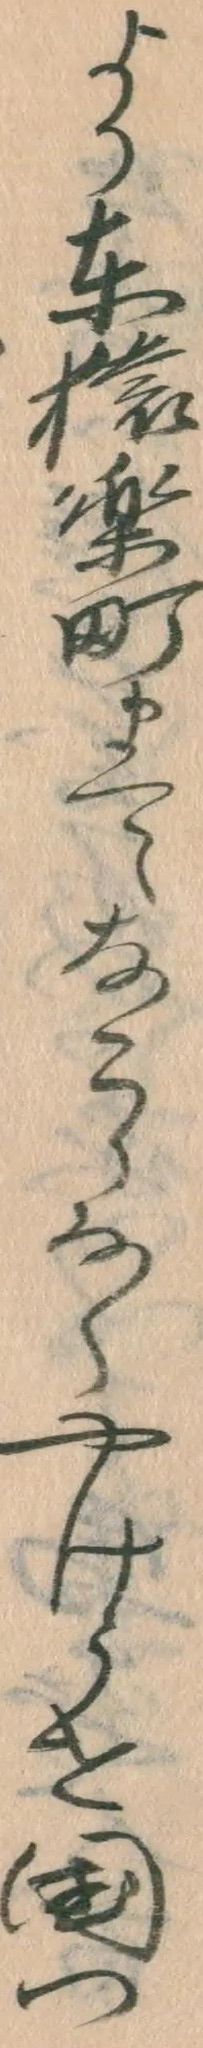より東猿楽町まてなこりなくやけうせ国つ
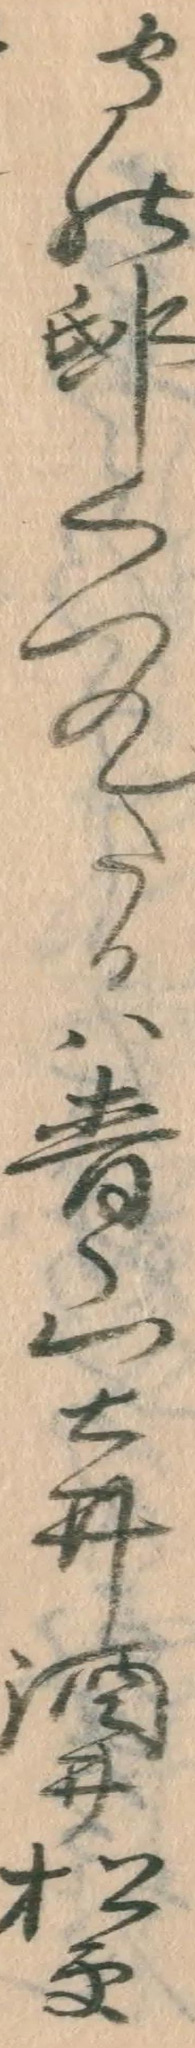守の邸くつれたるハ青山土井酒井松平
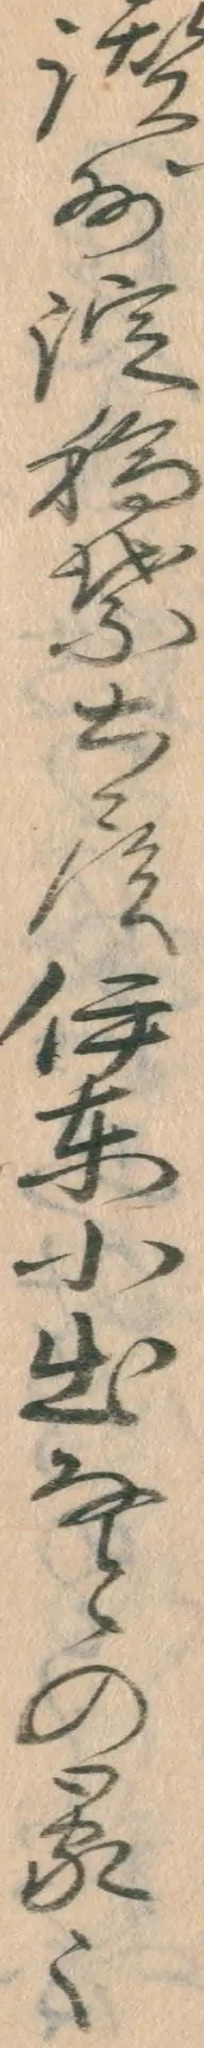讃州淀稲葉土屋伊東小出なとの御家々
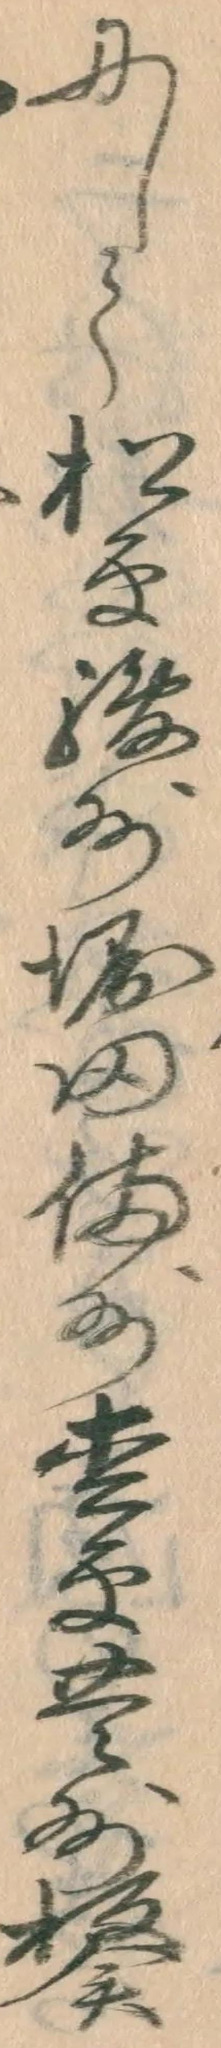にして松平駿州堀田備州松平豊州板倉
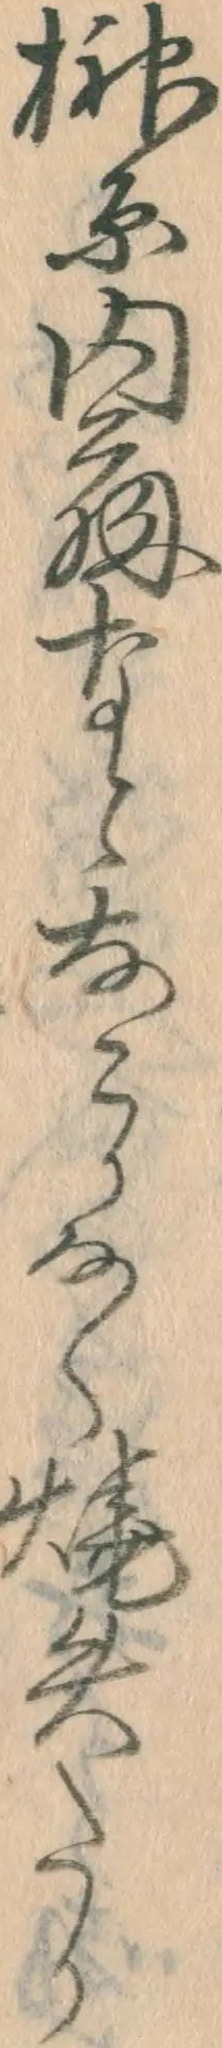榊原内藤なとなこりなく燒失たり
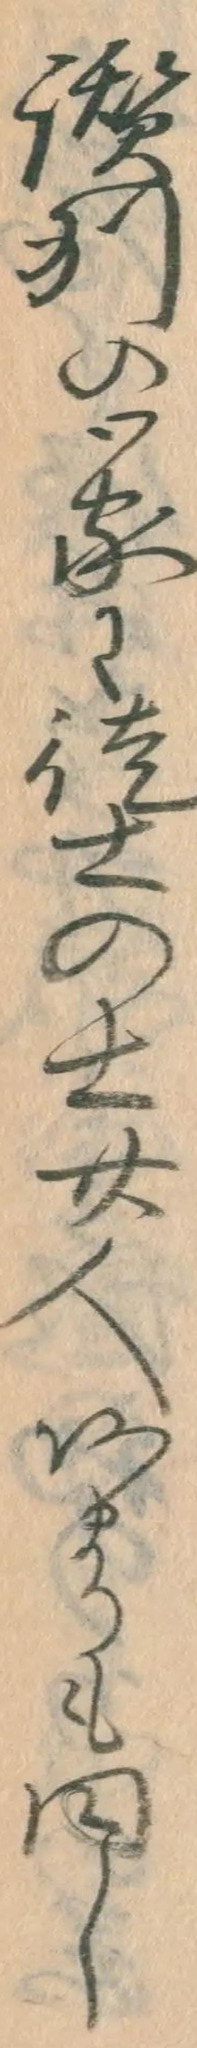讃州の御家に徒士の士廿人あまりも同し

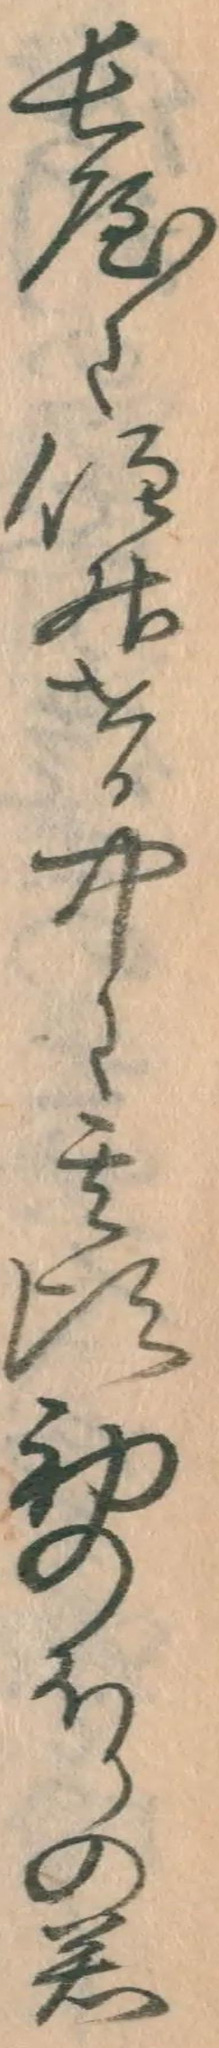長屋に住居せる中に其頃初のほりの若
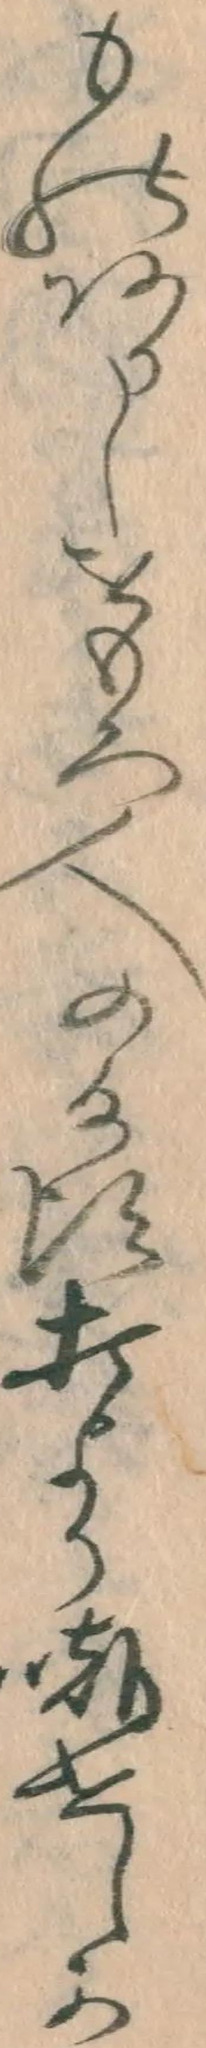ものありしをもろ人の日頃打より噺せしか
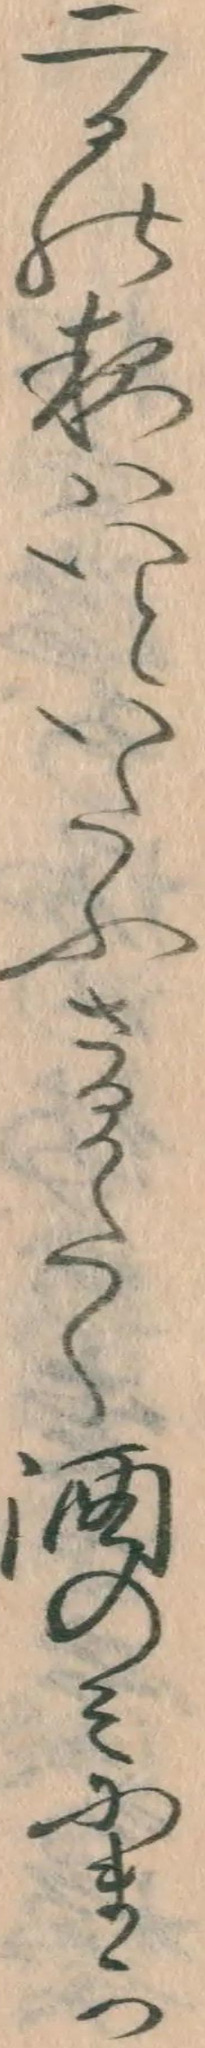二日の夜ハいといたふさるかたく酒のミにまか
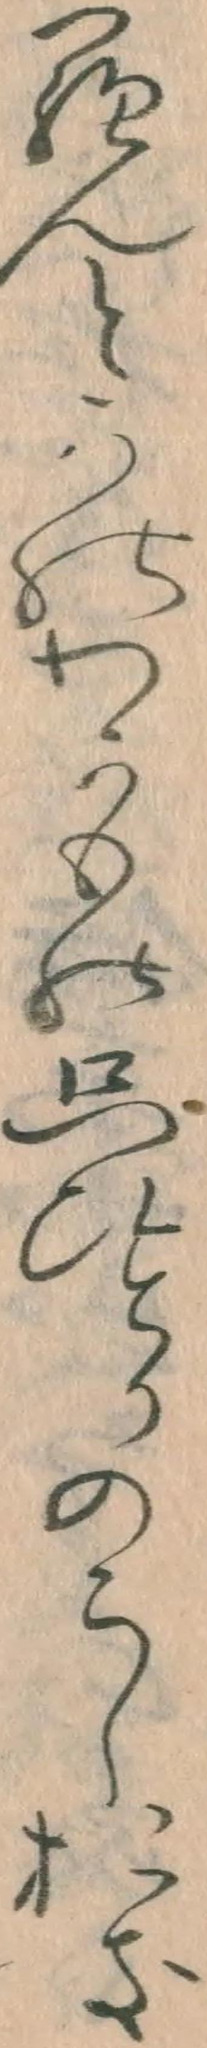らんとかのわかもの只ひとりのこしおき
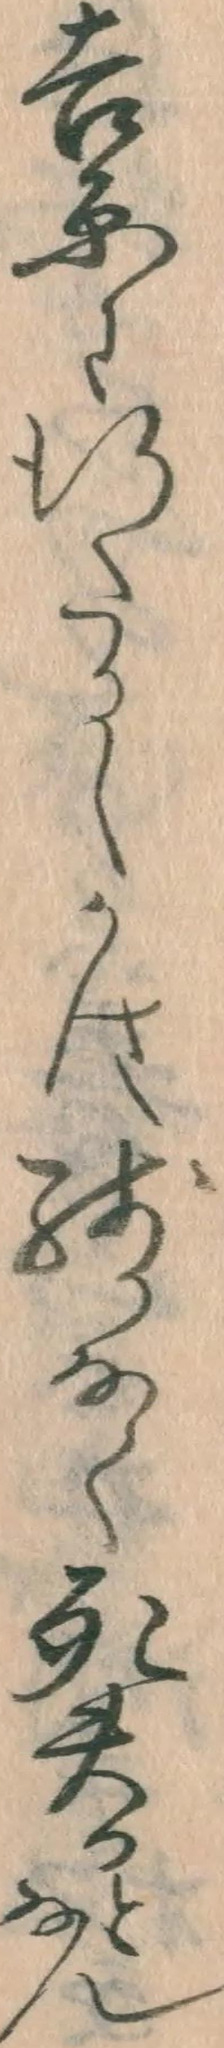吉原に行たりしかは残りなく死失るとなん
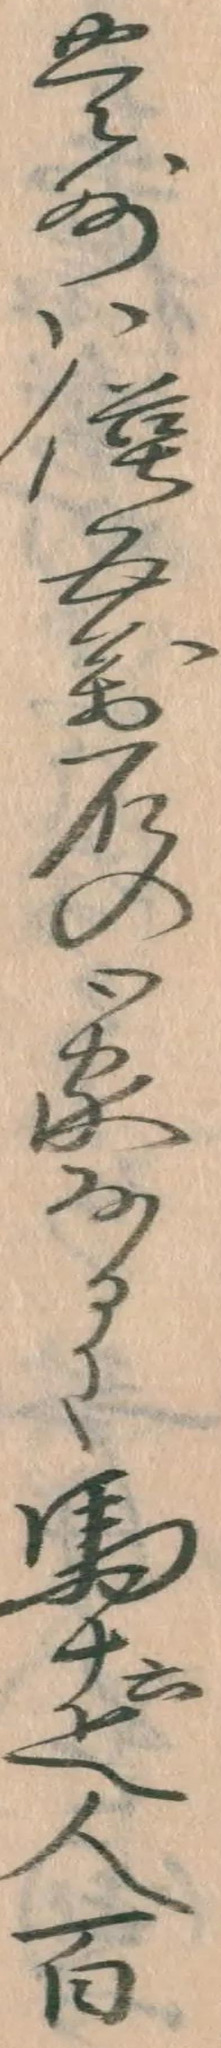豊州ハ僅五萬石の御家なるに馬十六疋人百
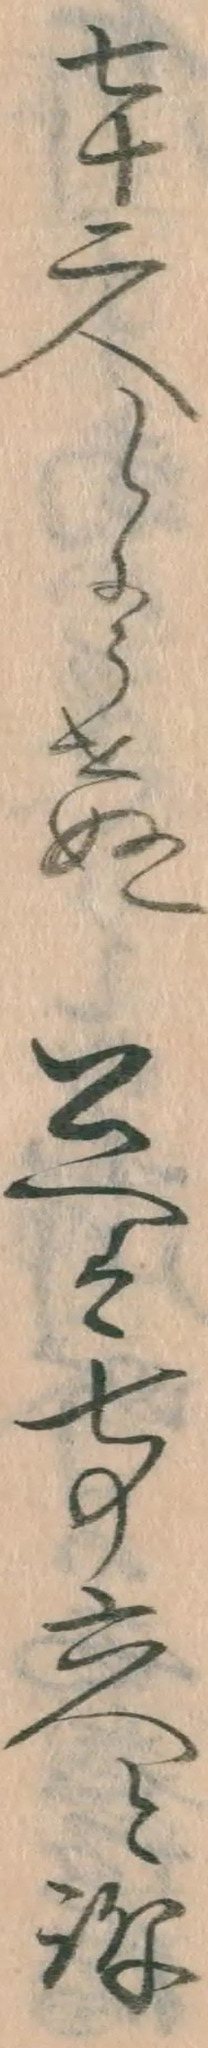七十二人しにうせぬ公へは七十六人と訴
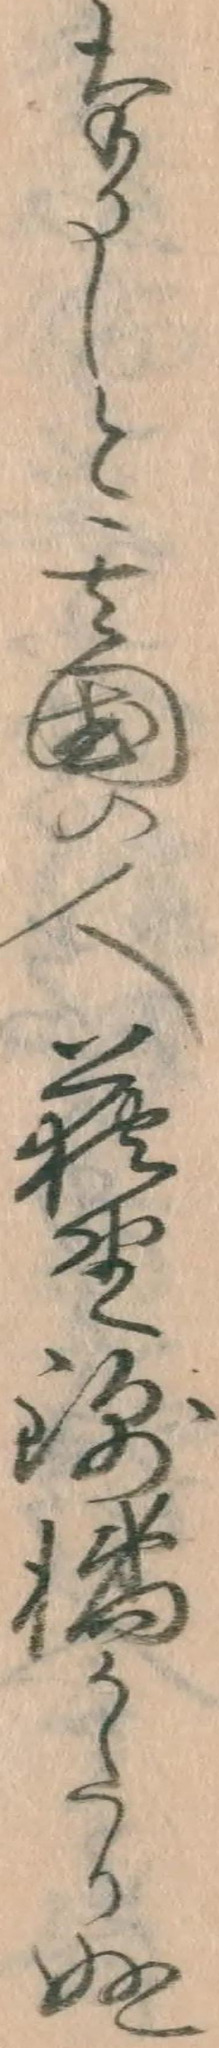奉りしと其国の人荻野錦橘かたりぬ
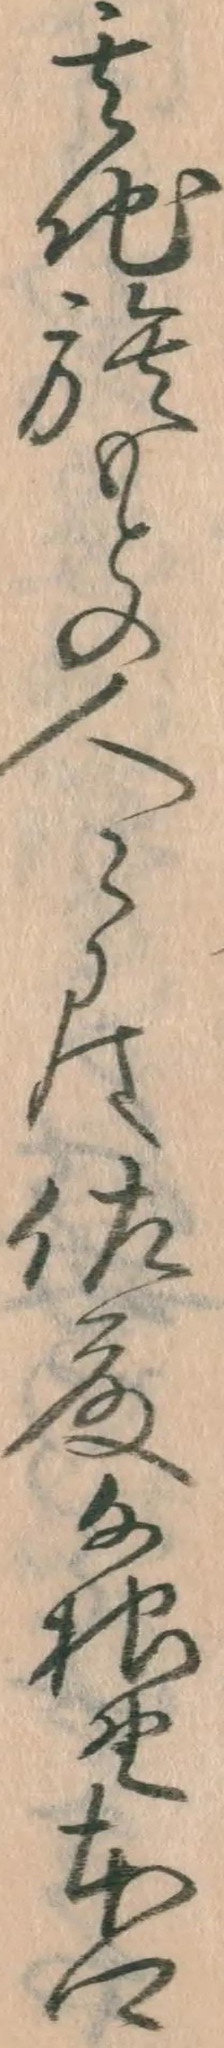其他族もとの人々には佐藤千根野本郷
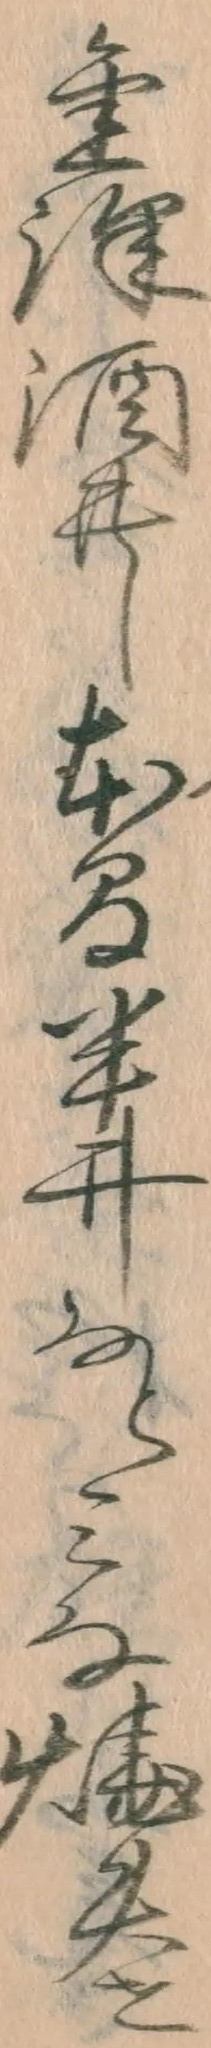金澤酒井本間半井なとミな燒失せ
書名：麗斎叢書. 20
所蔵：国立国会図書館 National Diet Library, JAPAN
